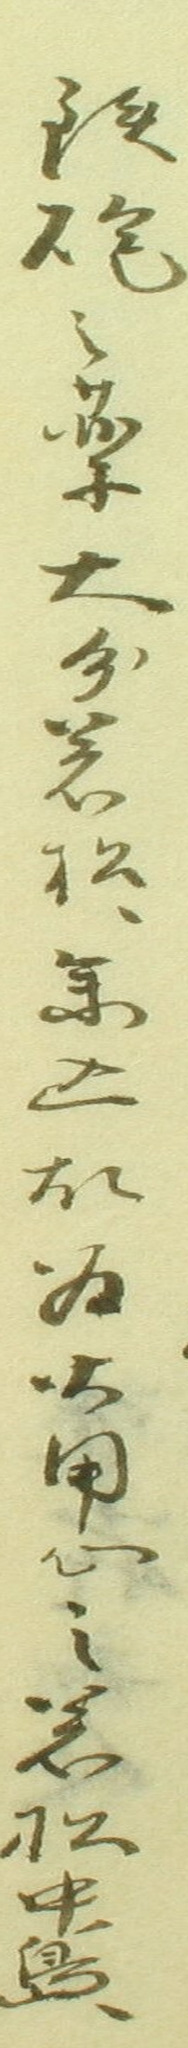一鉄砲之薬大分若松へ参込故為火用心之若松中ノ島へ
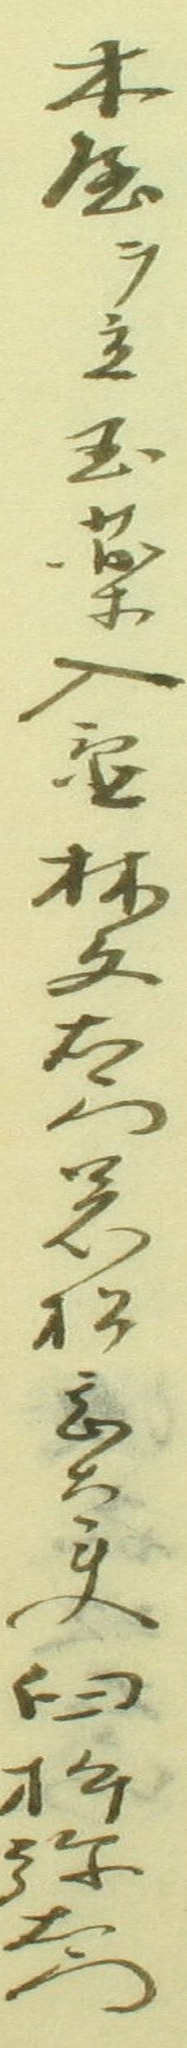木屋ヲ立玉薬入置林文右衛門若松甚太夫臼杵弥右衛門
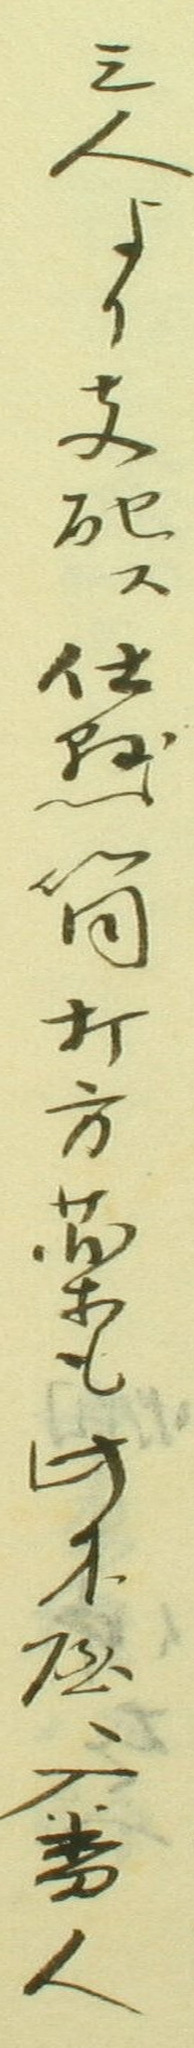三人より支配ス仕然筒打方薬も此木屋へ入番人
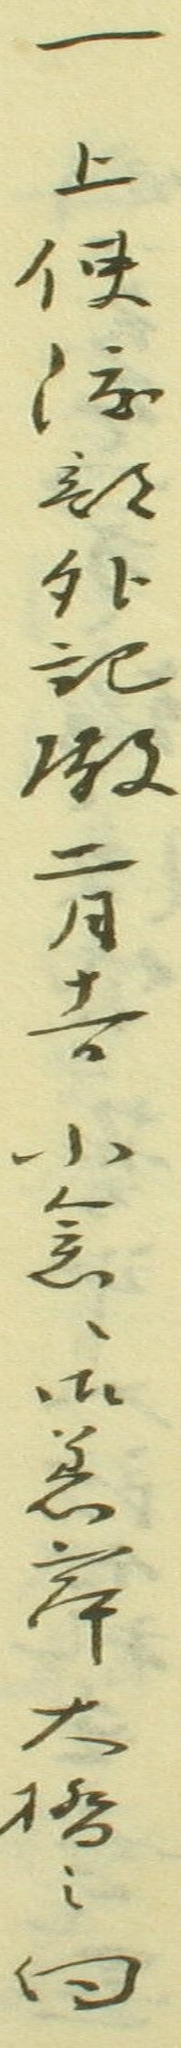一上使渡部外記殿二月十一日小倉へ御着岸大橋之向
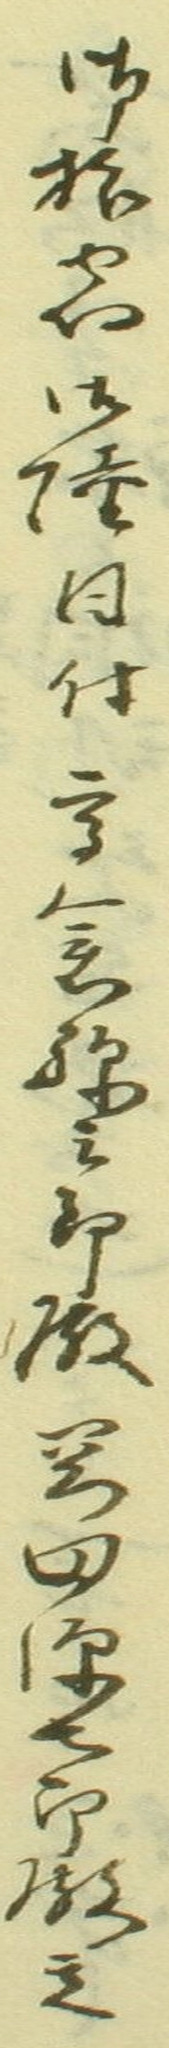御旅宿御陸目付高倉弥三郎殿岡田源七郎殿其
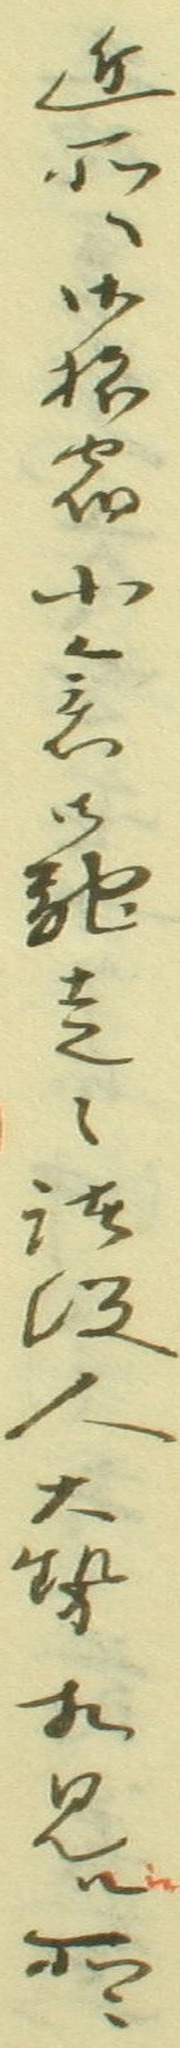近所へ御旅宿小倉御馳走之諸役人大勢相見江所々
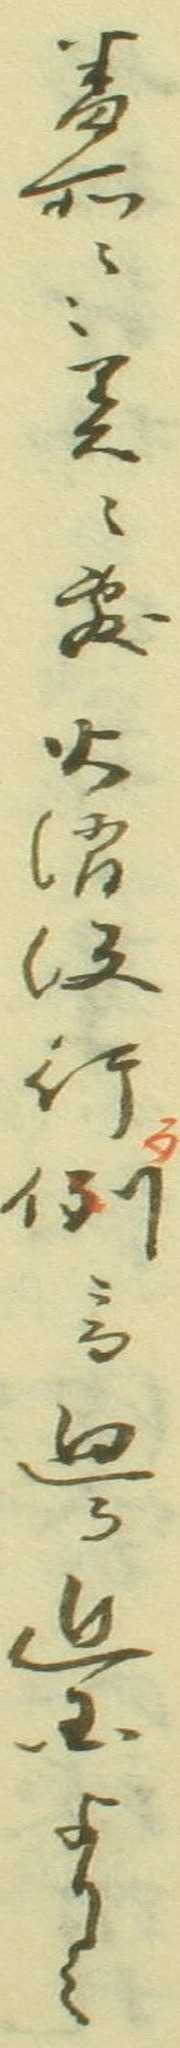番所々々美々敷火消役行列ニ而廻る近国より之
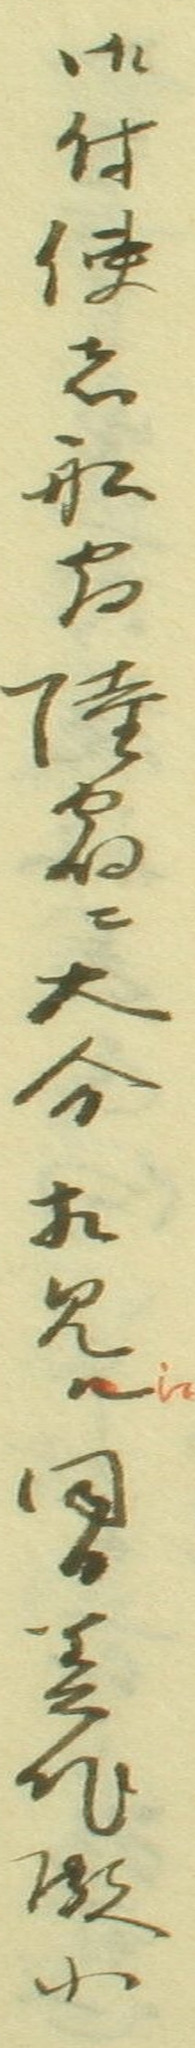御付使者船宿陸宿ニ大分相見江同日美作殿小
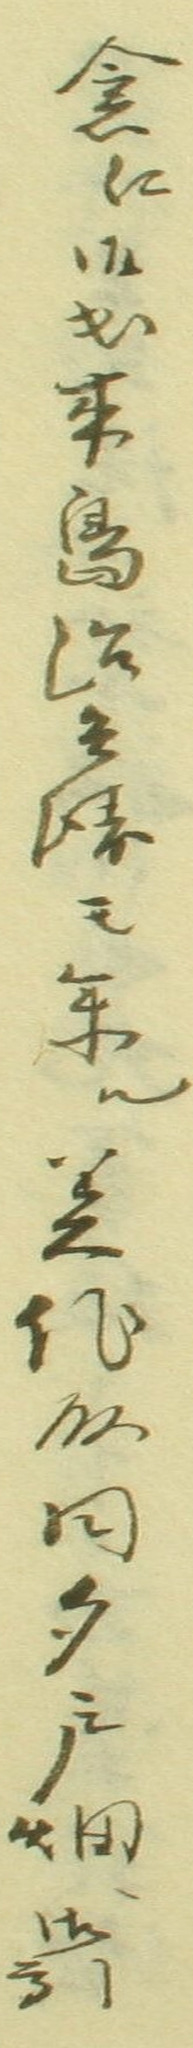倉江御出来島治兵衛モ参ル美作殿同夕戸畑へ御引
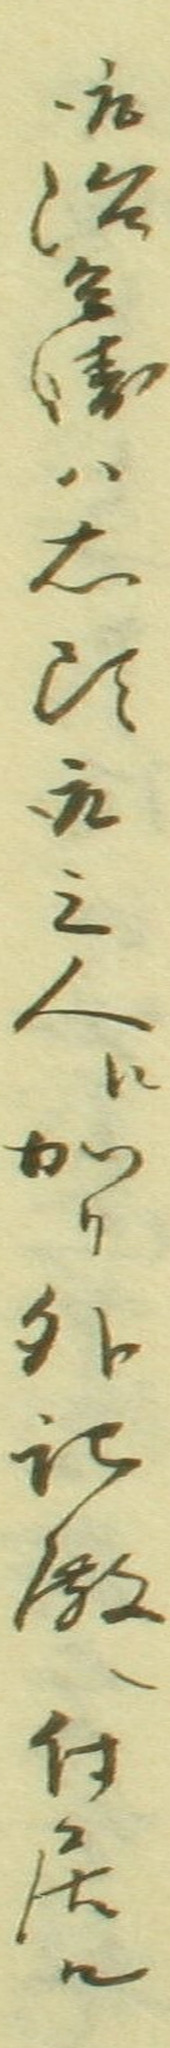取治兵衛ハ右頭取三人に加り外記殿へ付居ル
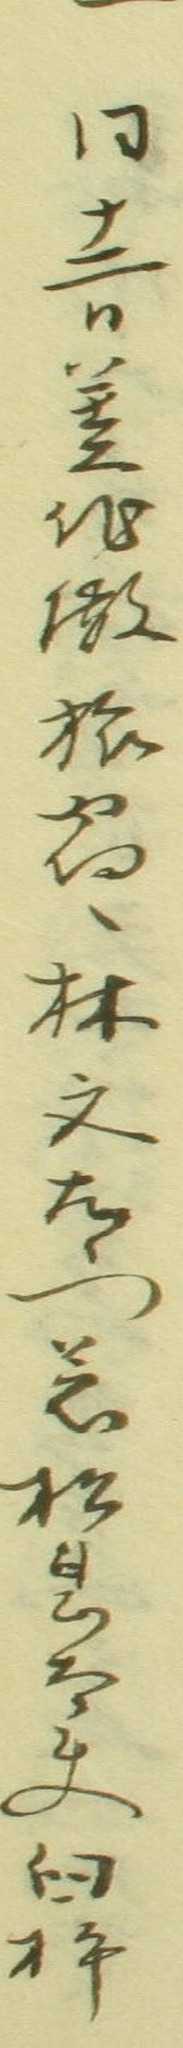一同十二日美作殿旅宿へ林文右衛門若松甚太夫臼杵
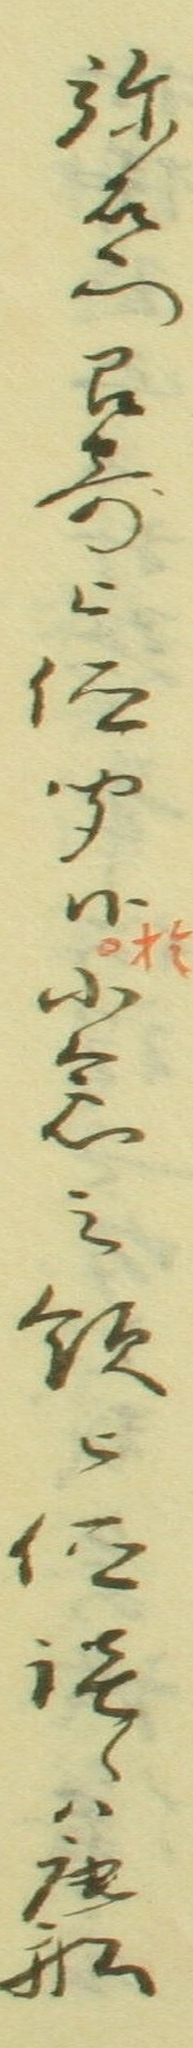弥右衛門召寄被仰聞候於小倉三領被仰談候ハ唐船

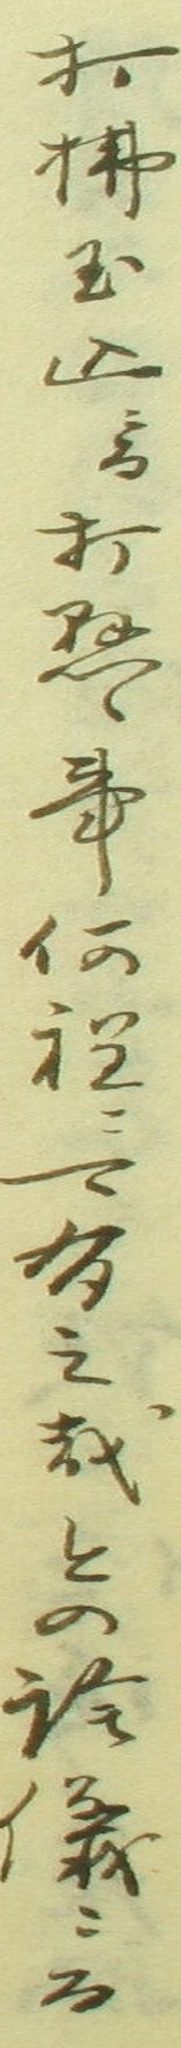打払玉込ニ而打懸候事何程ニ可有之哉との詮議ニ而
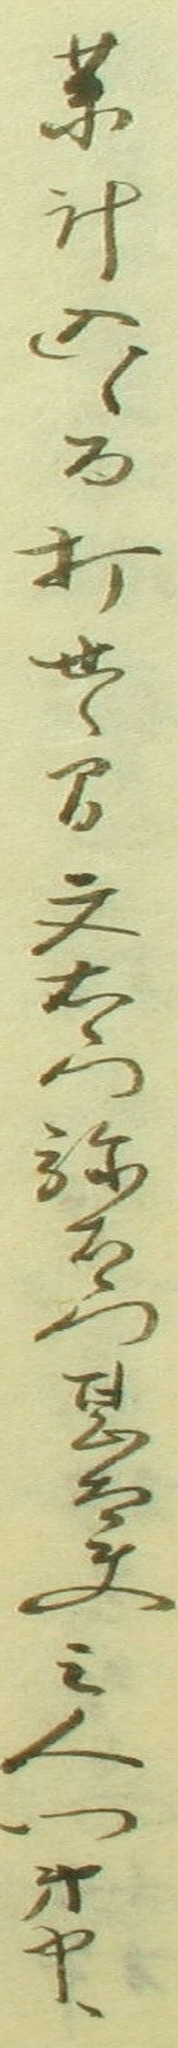薬計込候而打せ候間文右衛門弥右衛門甚太夫三人門弟中へ
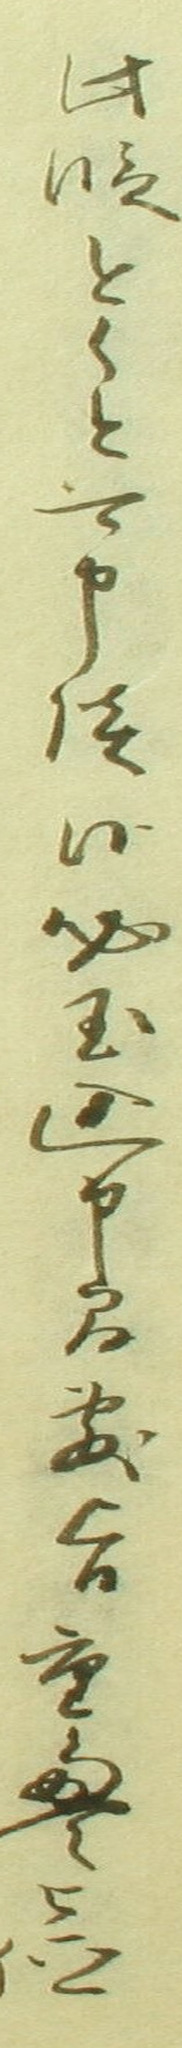此段とくと可申談候必玉込申間敷旨重畳被仰
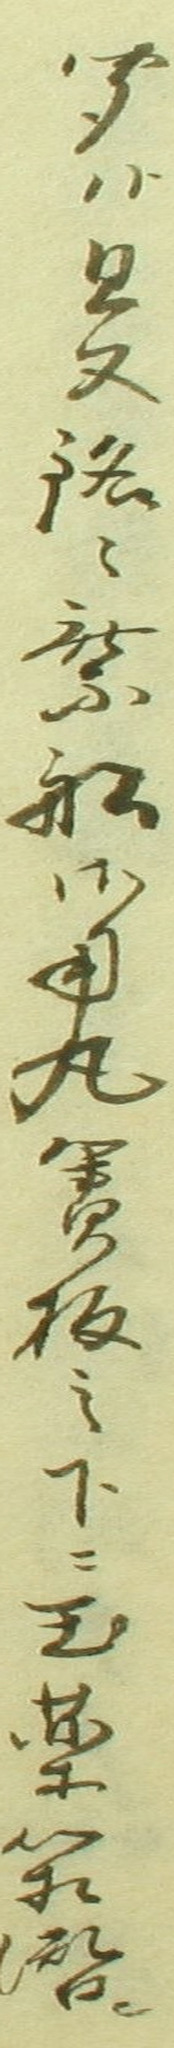聞候且又銘々乗船御用丸簀板之下ニ玉薬箱潜
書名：唐船漂流記 二
